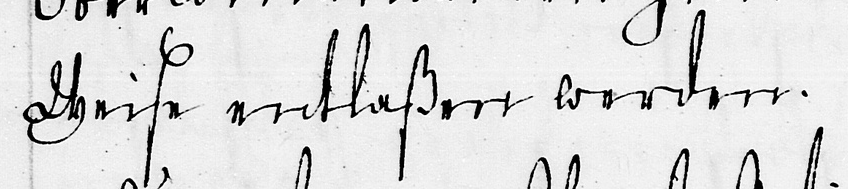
Weise entlaßen werden.
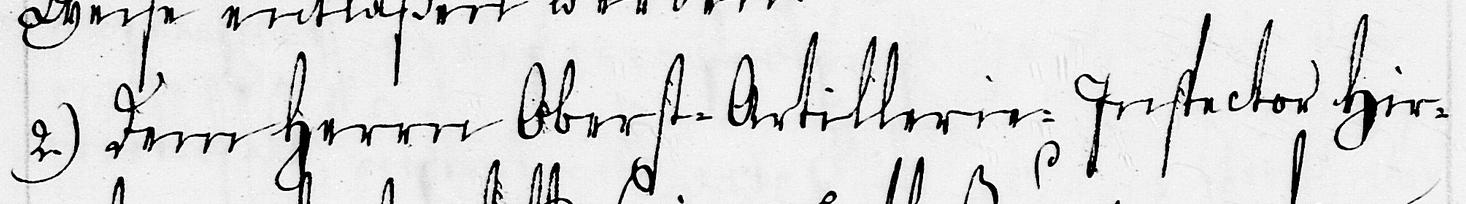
2.) Dem Herrn Oberst-Artillerie-Inspector Hir¬
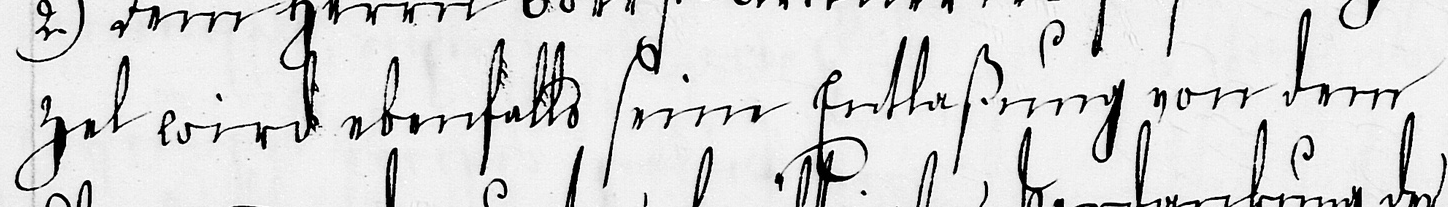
zel wird ebenfalls seine Entlaßung von dem
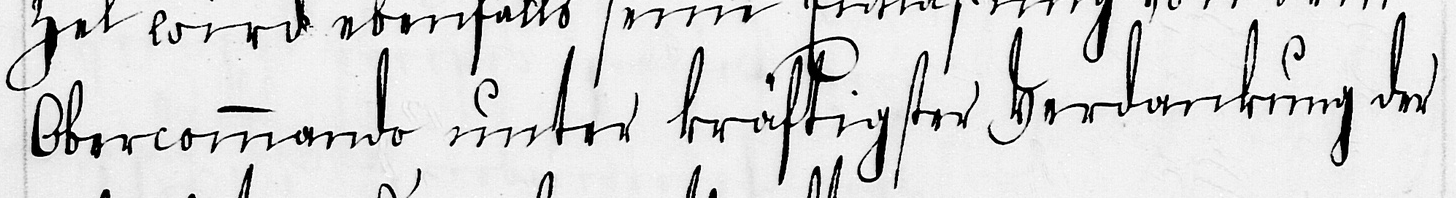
Obercommando unter kräftigster Verdankung der
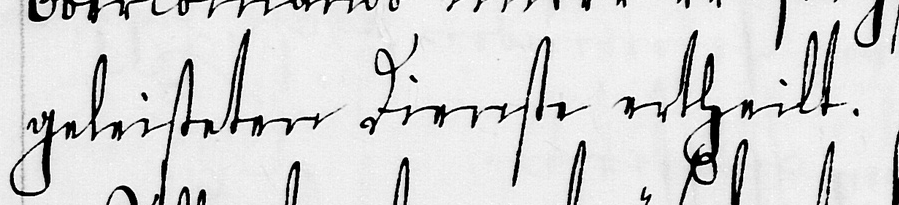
geleisteten Dienste ertheilt.
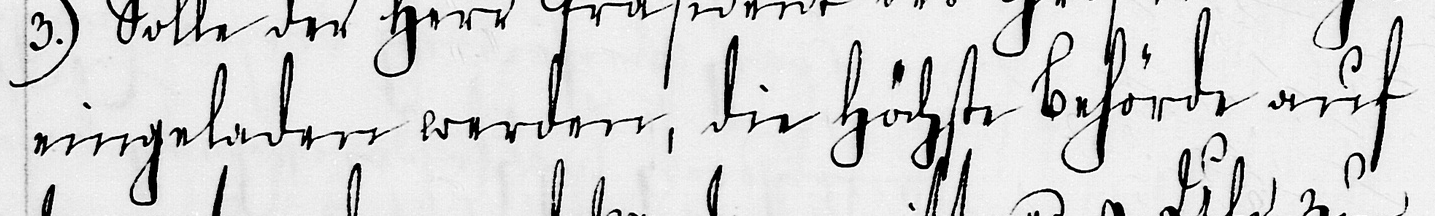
eingeladen werden, die Höchste Behörde auf
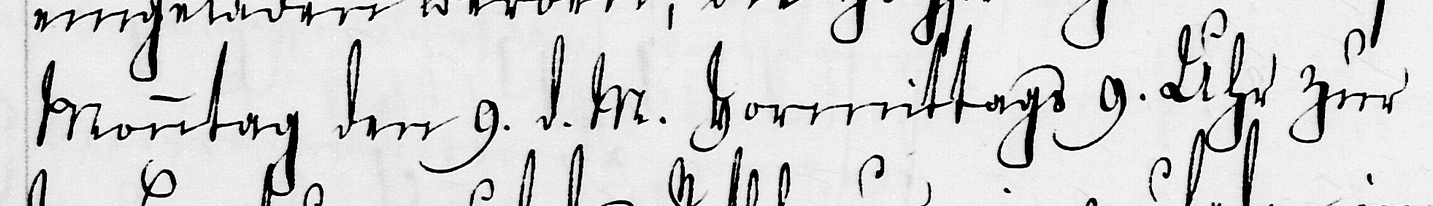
Monntag den 9. d. M. Vormittags 9. Uhr zur
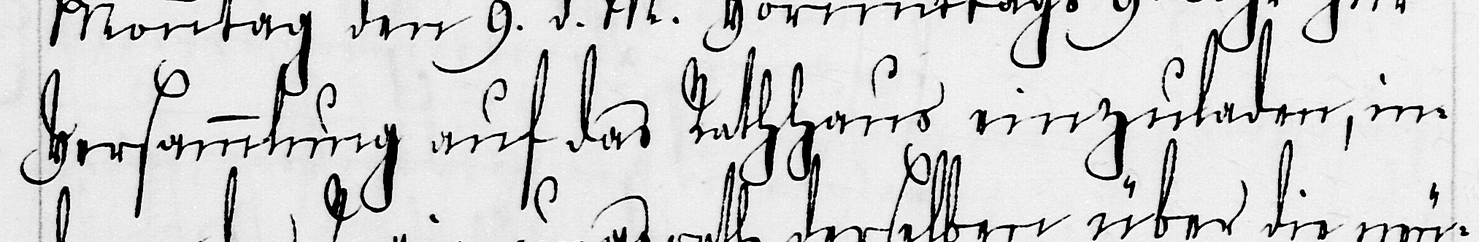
Versammlung auf das Rathhaus einzuladen, in¬
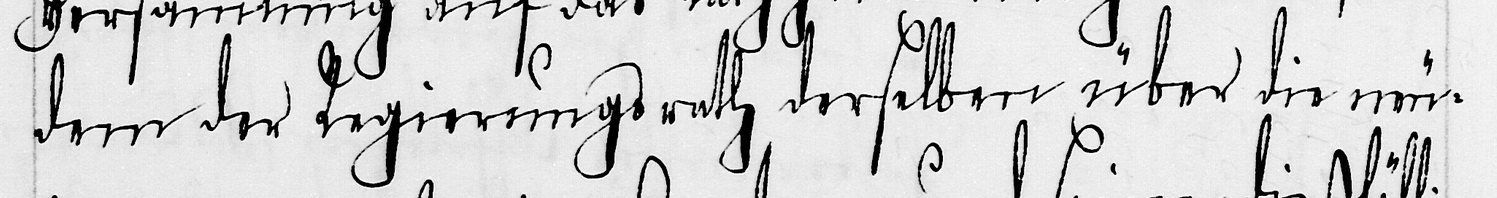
dem der Regierungsrath derselben über die neu¬
